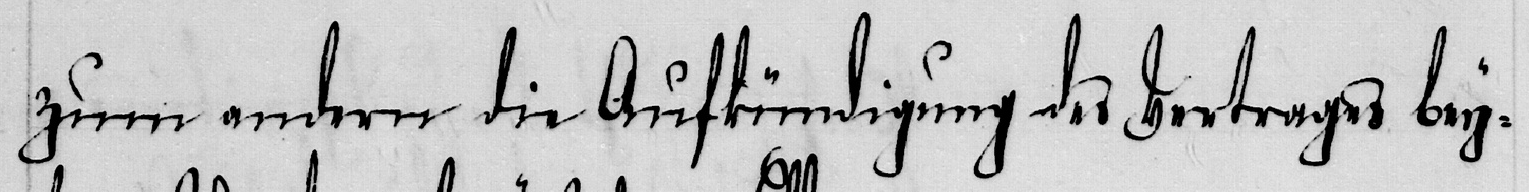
zum andern die Aufkündigung des Vertrages bey¬
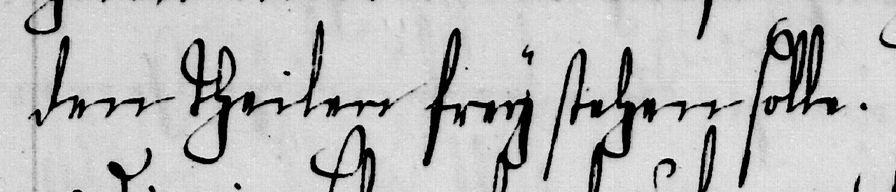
den Theilen frey stehen solle.
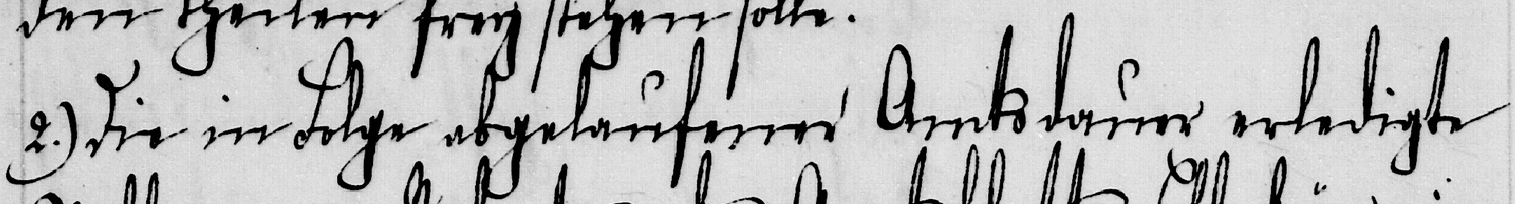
2.) Die in Folge abgelaufener Amtsdauer erledigte
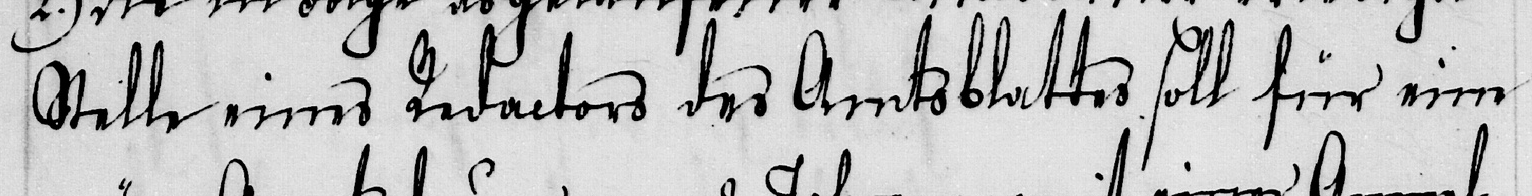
Stelle eines Redactors des Amtsblattes soll für eine
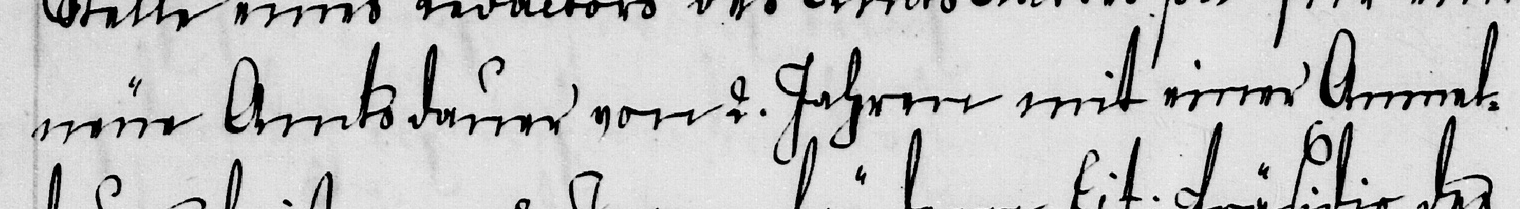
neue Amtsdauer von 2. Jahren mit einer Anmel¬
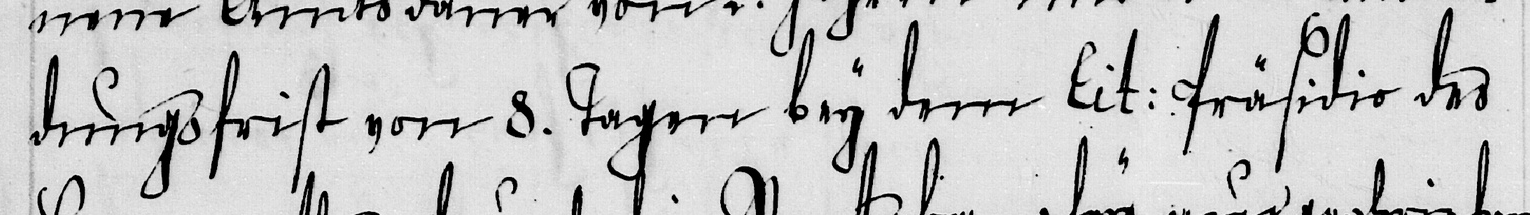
dungsfrist von 8. Tagen bey dem lit: Präsidio des
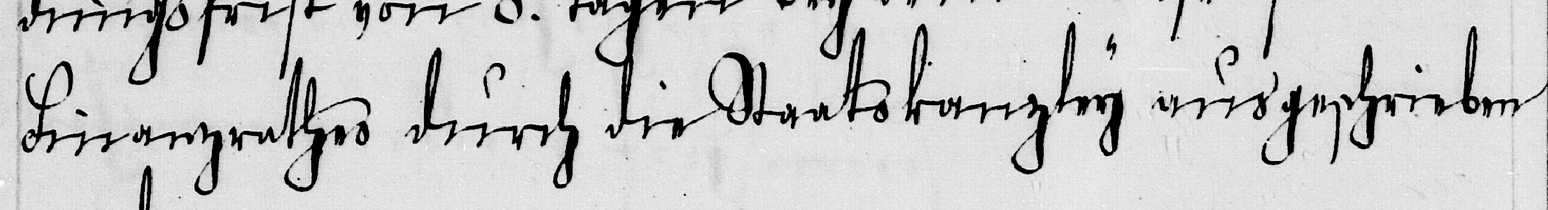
Finanzrathes durch die Staatskanzley ausgeschrieben
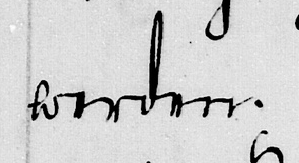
werden.
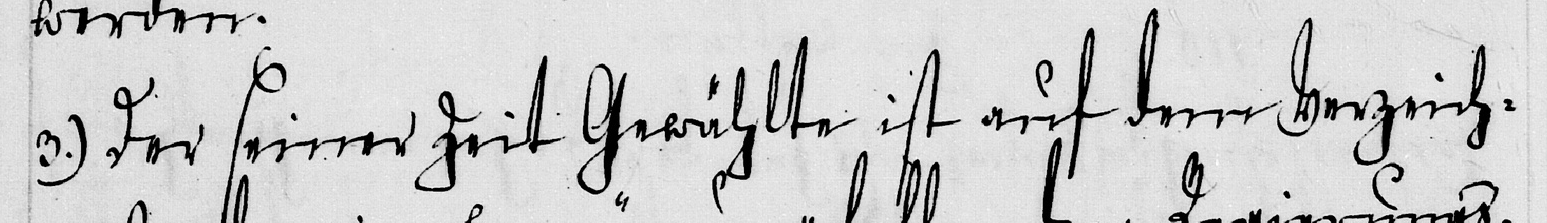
3.) Der seiner Zeit Gewählte ist auf dem Verzeich¬
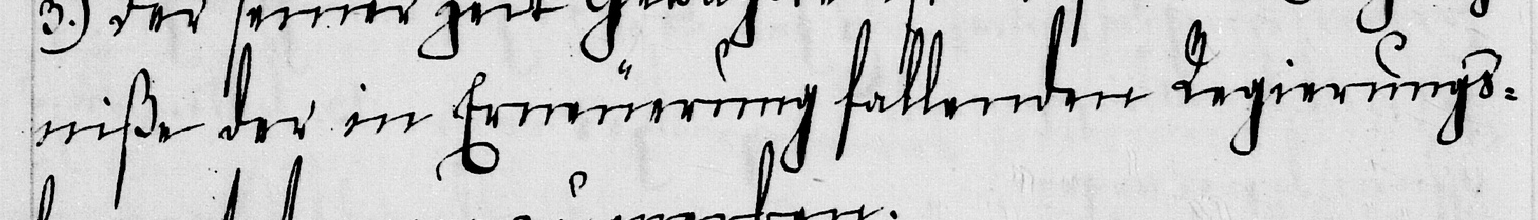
niße der in Erneuerung fallenden Regierungs¬
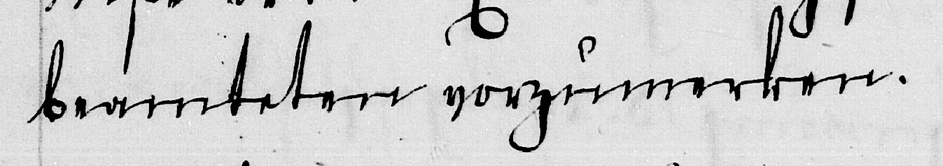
beamteten vorzumerken.
